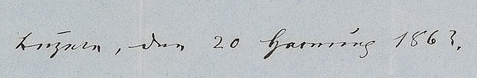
Luzern, den 20 Hornung 1863.
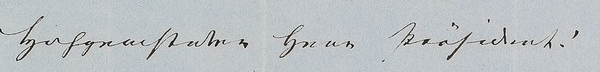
Hochgeachteter Herr Präsident!
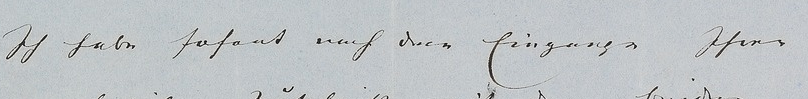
Ich habe sofort nach dem Eingange Ihrer
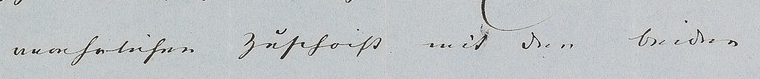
verehrlichen Zuschrift mit den beiden
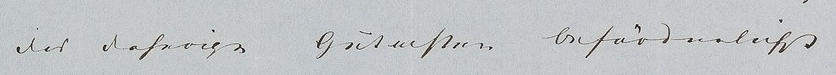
das daherige Gutachten beförderlichst
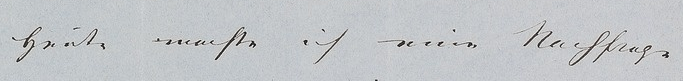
Heute machte ich eine Nachfrage
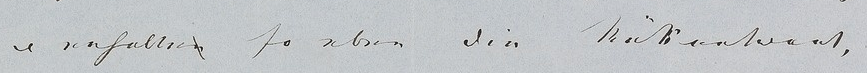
& erhalte so eben die Rükantwort,
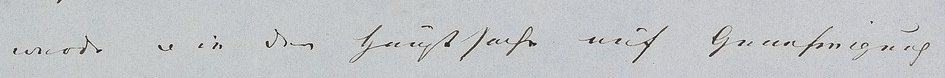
werde & in der Hauptsache auf Genehmigung
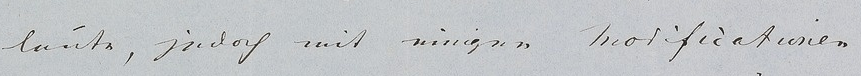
laute, jedoch mit einigen Modificationen,
